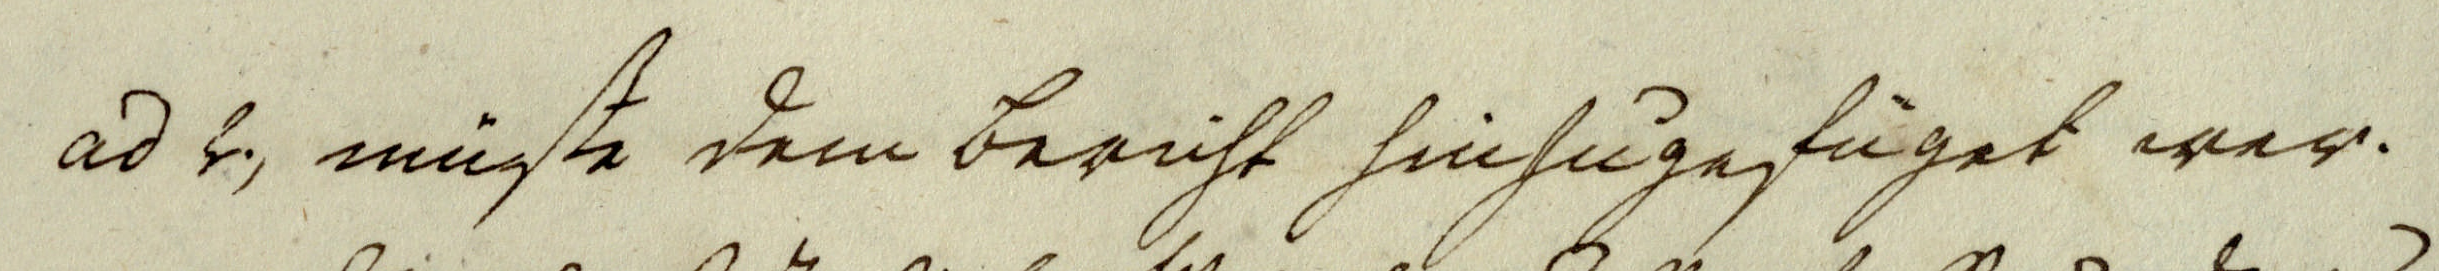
ad 2., müßte dem Bericht hinzugefüget wer¬
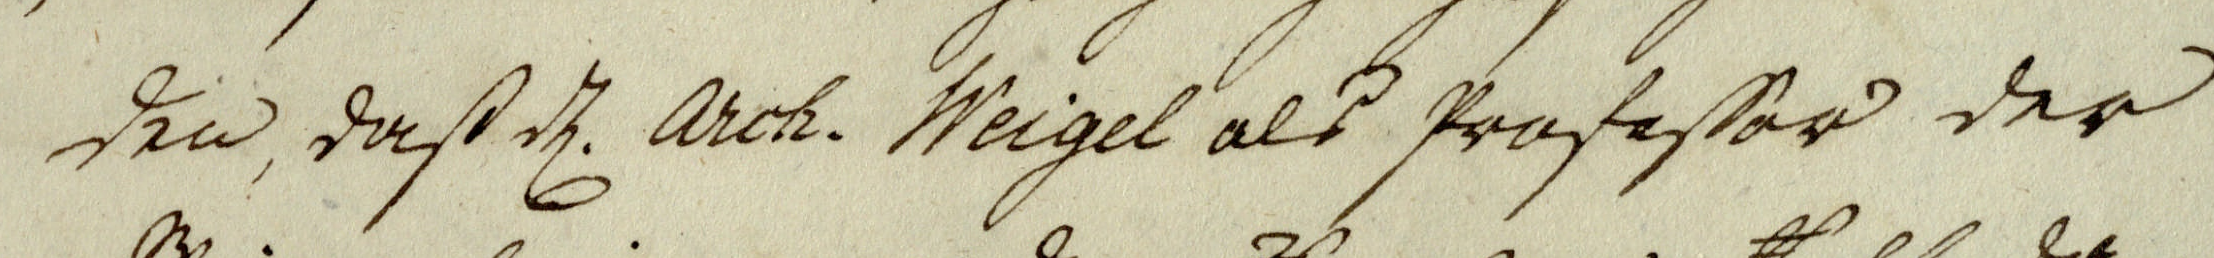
den, daß dh. Arch. Weigel als Professor der
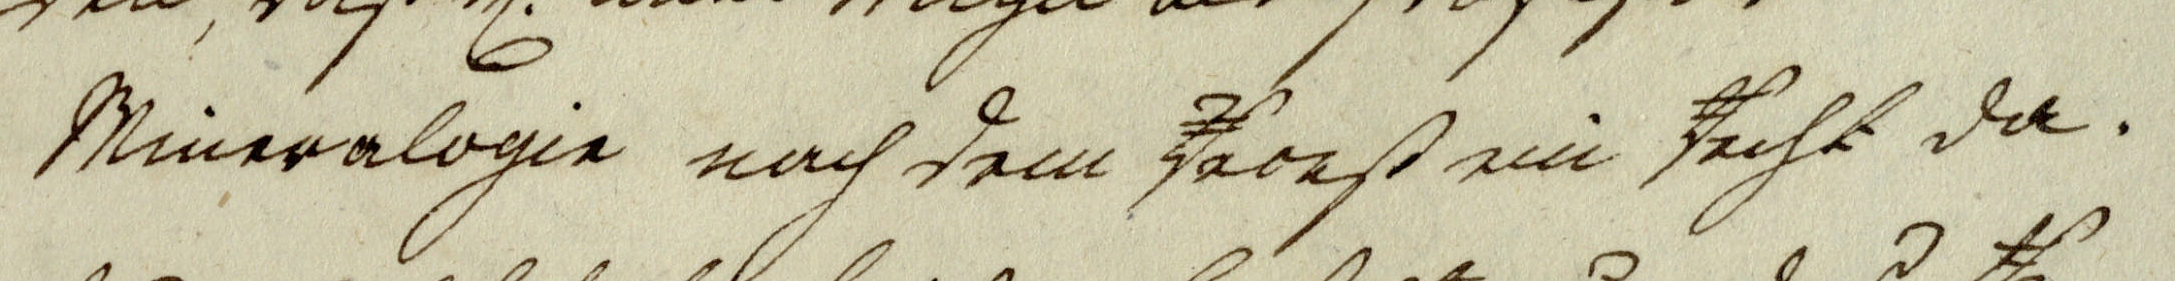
Mineralogie nach dem Receß ein Recht da¬
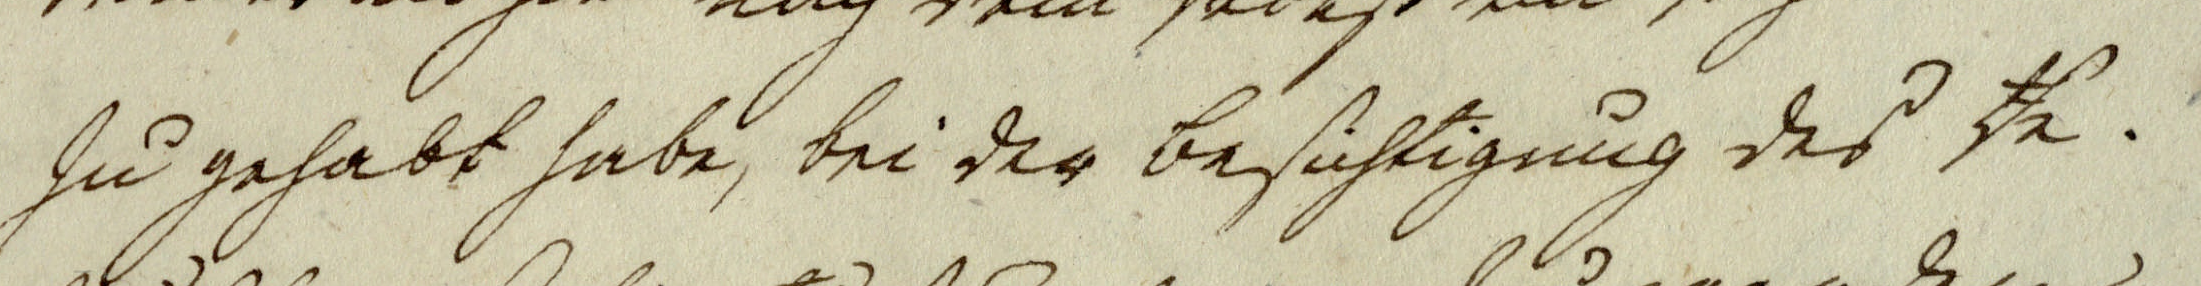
zu gehabt habe, bei der Besichtigung des Re¬
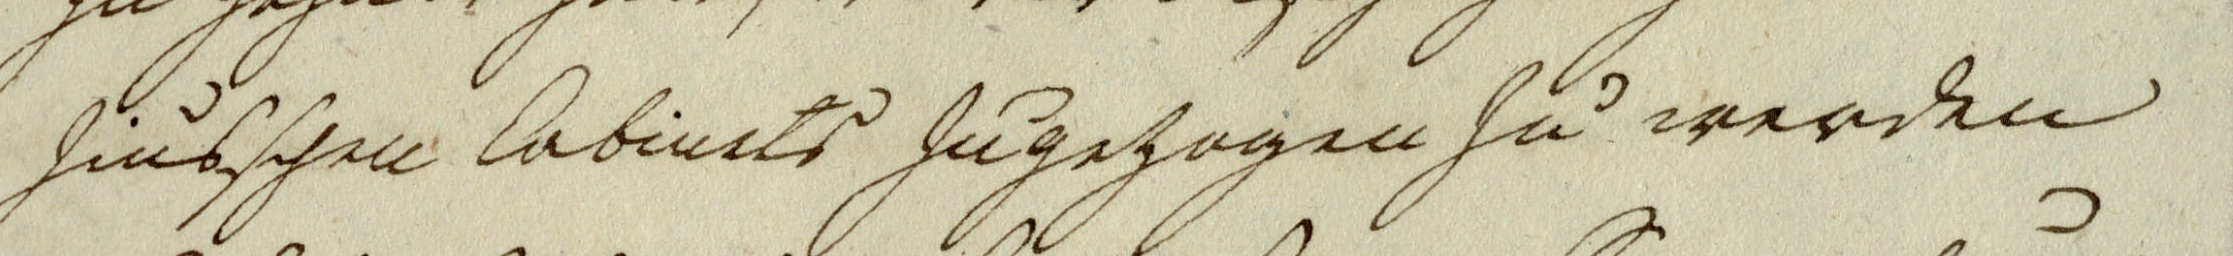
ziusschen Cabinets zugezogen zu werden
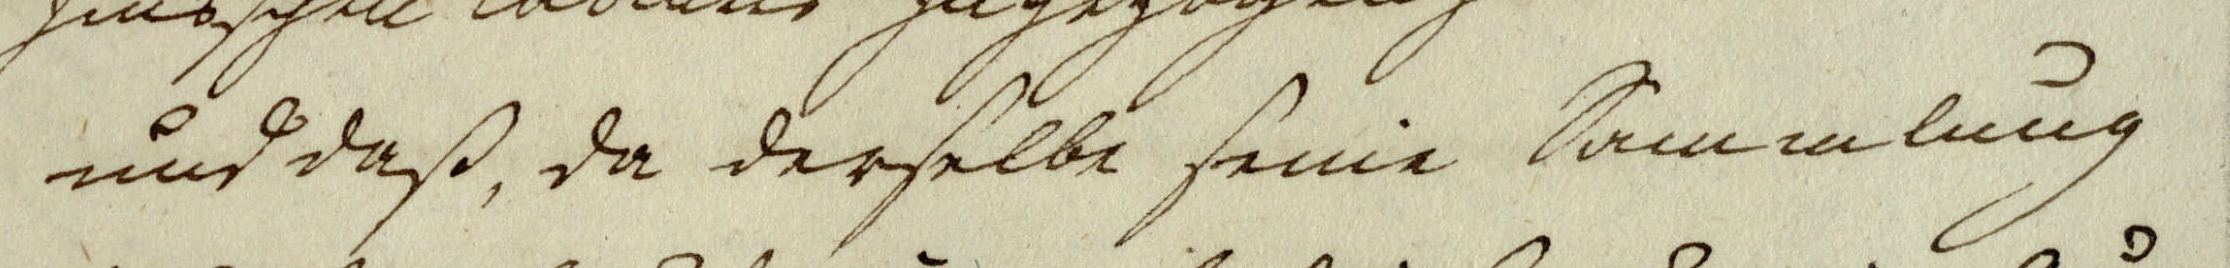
und daß, da derselbe seine Sammlung
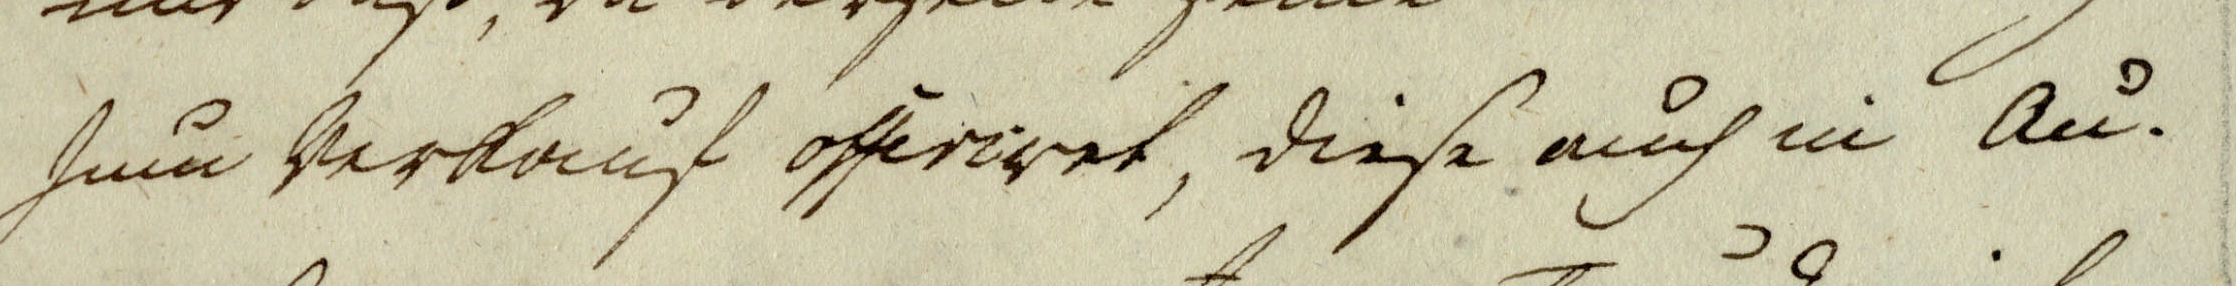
zum Verkauf offeriret, diese auch in Au¬
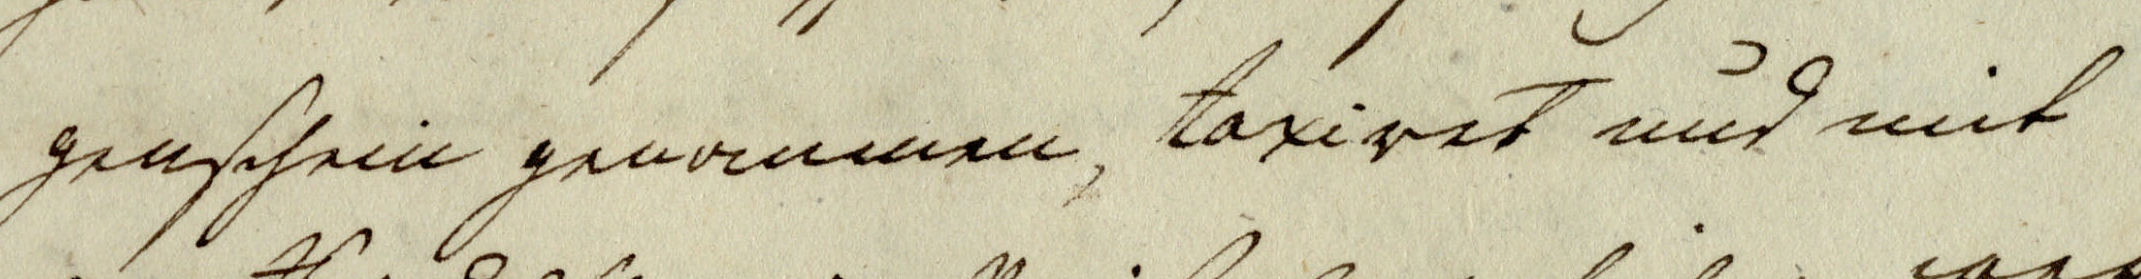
genschein genommen, taxiret und mit
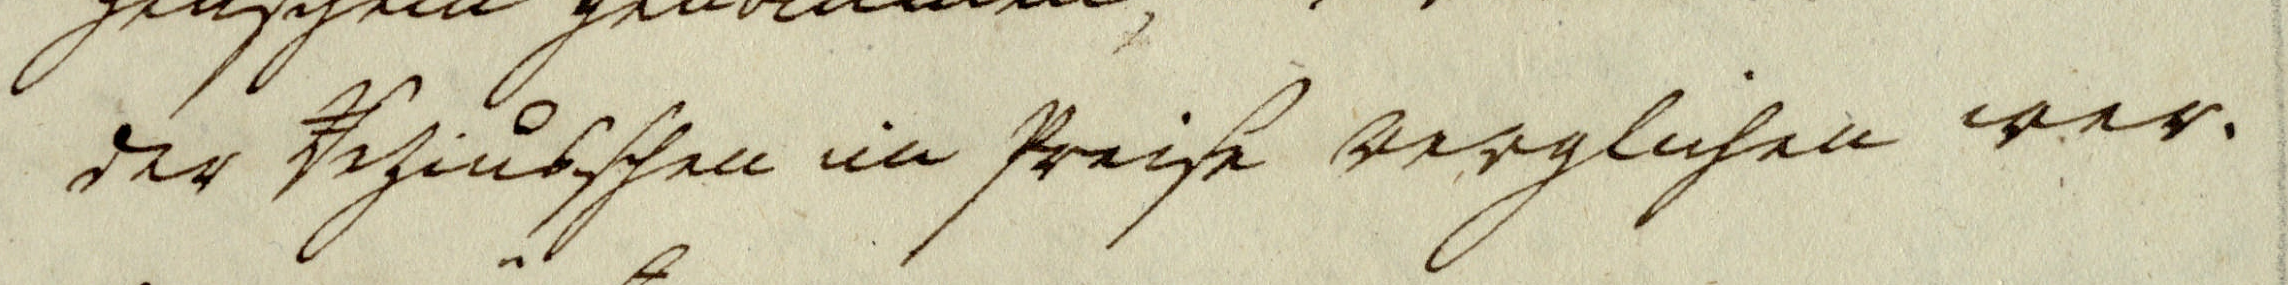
der Reziusschen im Preise verglichen wer¬
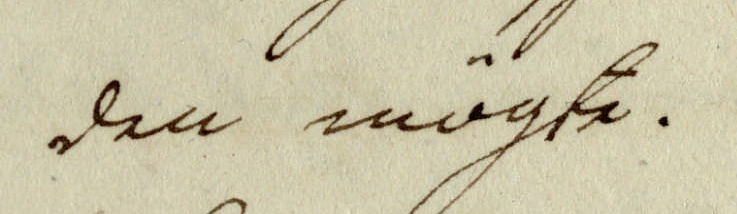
den mögte.
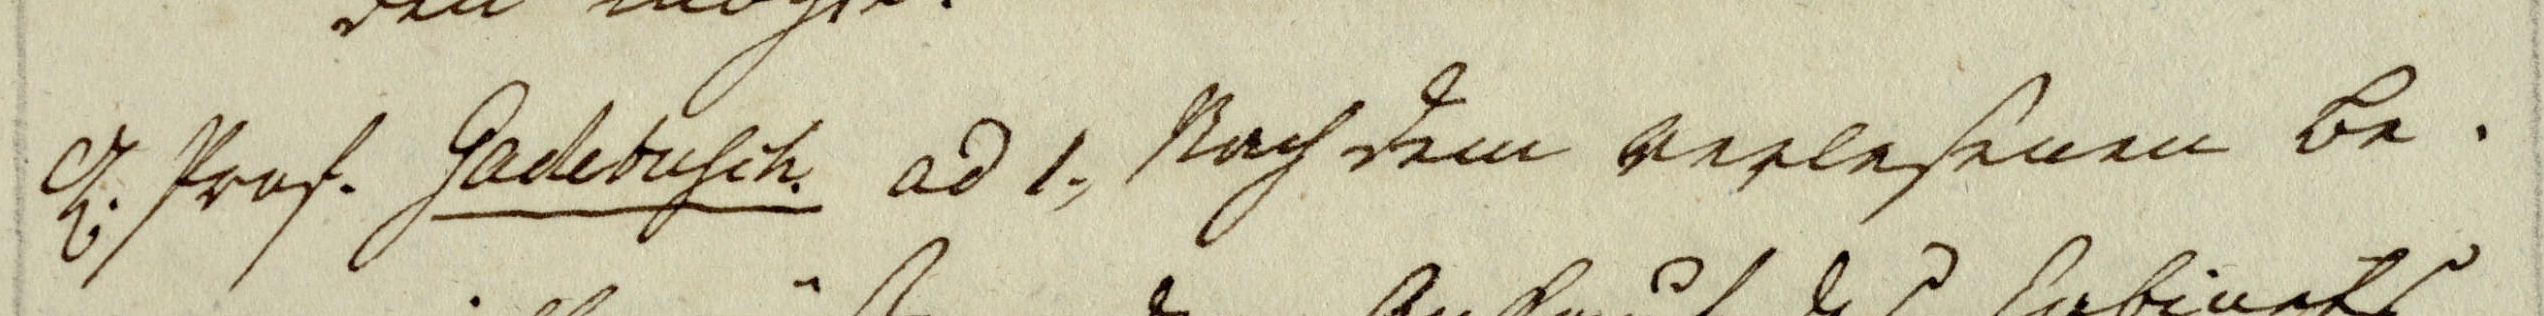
dh. Prof. Gadebusch ad 1. Nach dem verlesenen Be¬
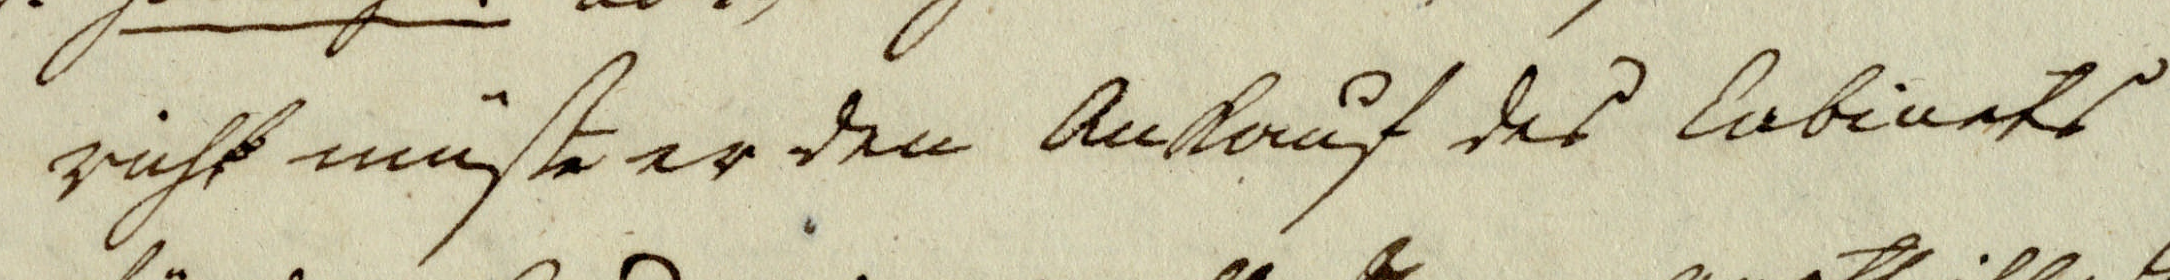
richt müßte er den Ankauf des Cabinets
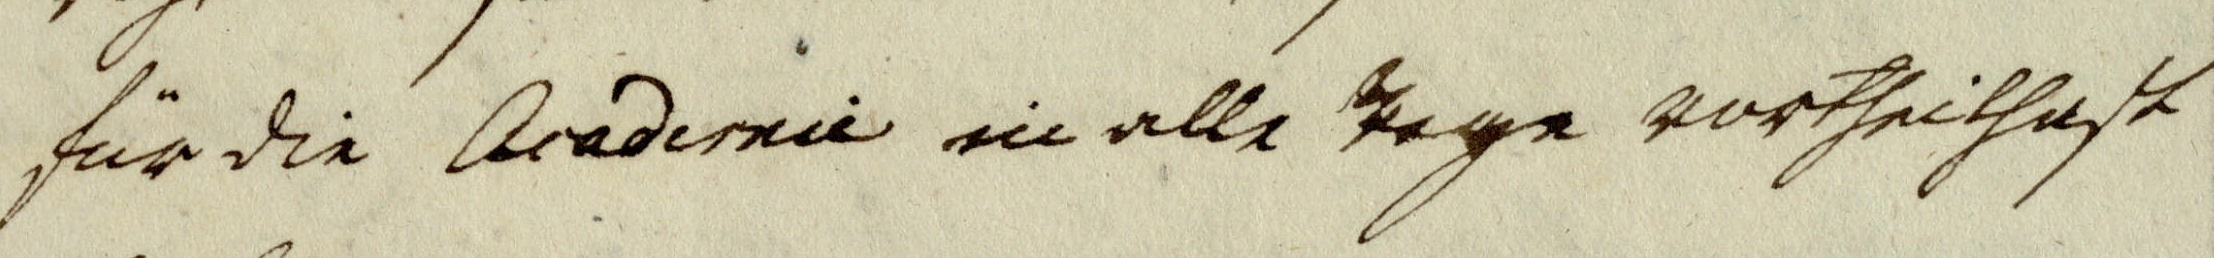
für die Academie in alle Wege vortheilhaft
